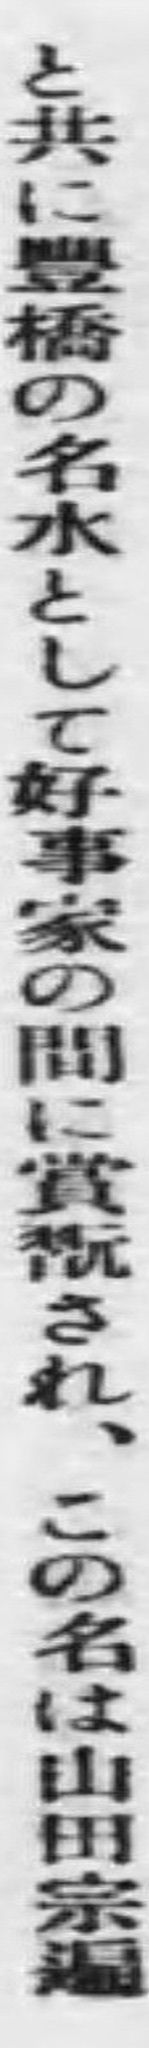と共に豊橋の名水として好事家の間に賞翫され、この名は山田宗遍
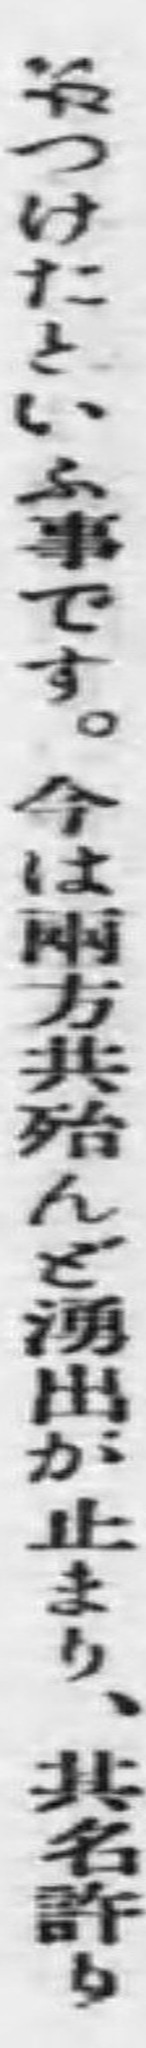がつけたといふ事です。今は両方共殆んど湧出が止まり、其名許り

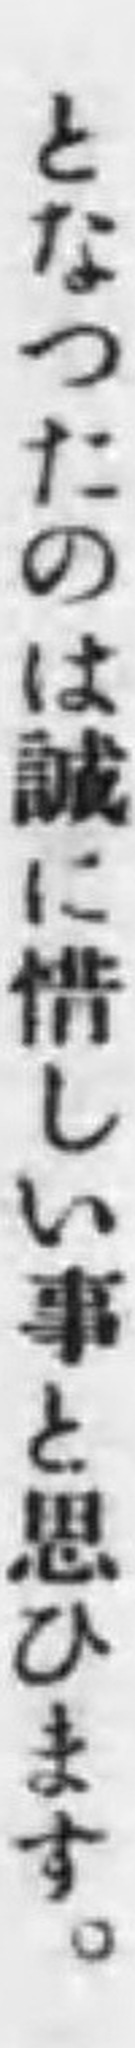となつたのは誠に惜しい事と思ひます。
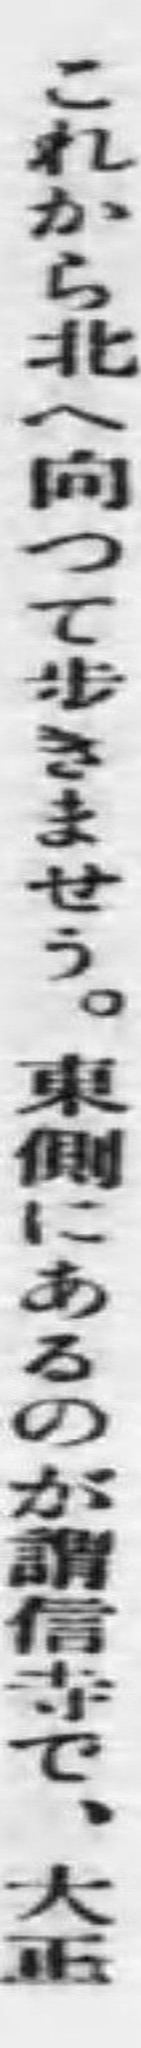これから北へ向つて歩きませう。東側にあるのが謂信寺で、大正
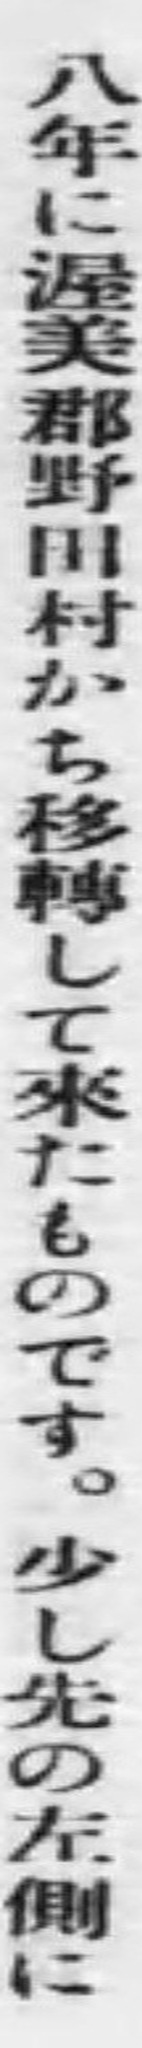八年に渥美郡野田村かち移転して来たものです。少し先の左側に
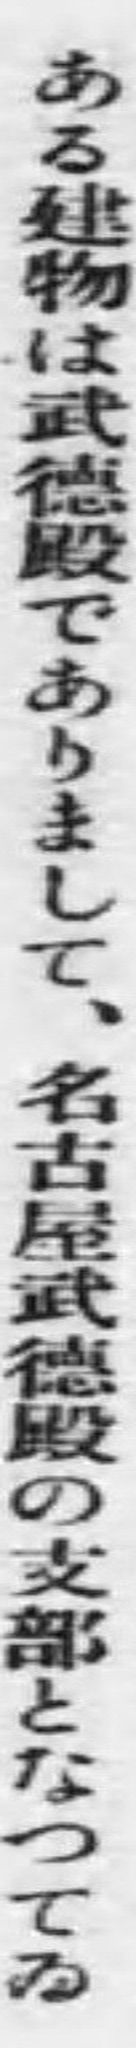ある建物は武徳殿でありまして、名古屋武徳殿の支部となつてゐ
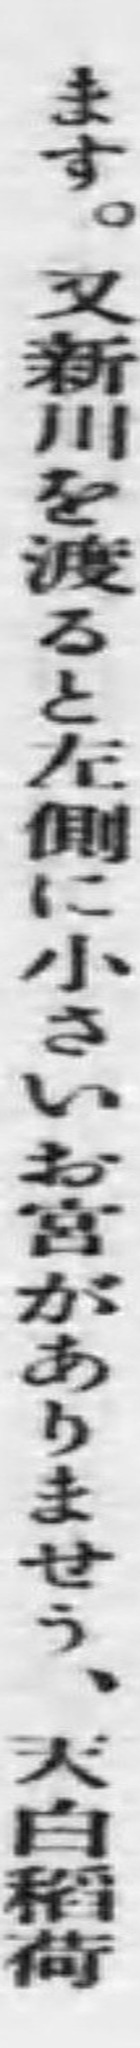ます。又新川を渡ると左側に小さいお宮がありませう、天白稲荷
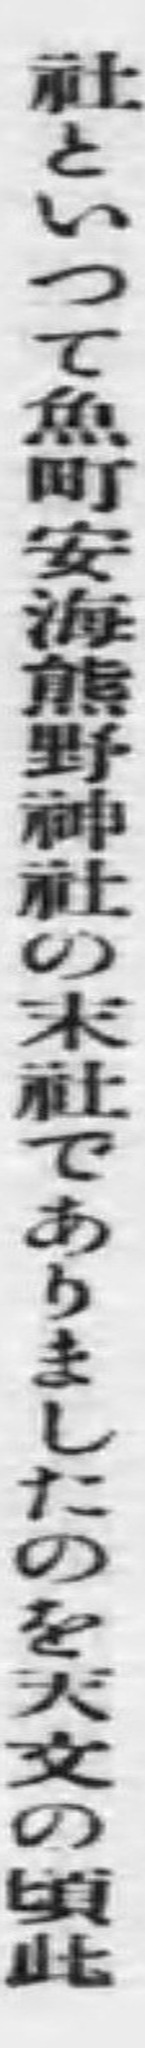社といつて魚町安海熊野神社の末社でありましたのを天文の頃此
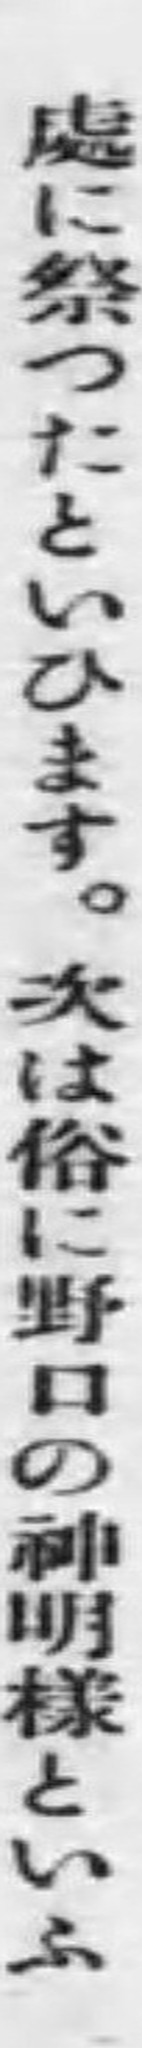処に祭つたといひます。次は俗に野口の神明樣といふ
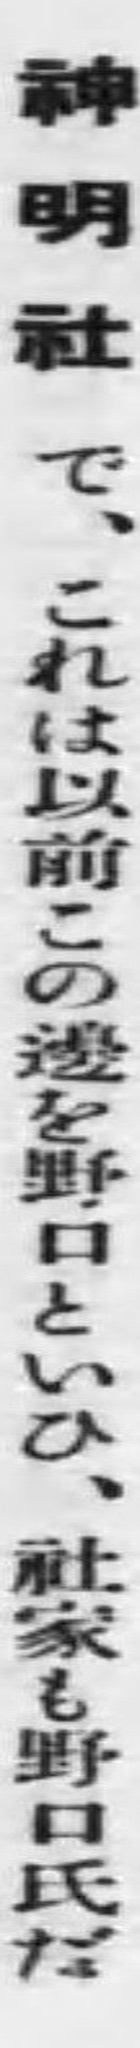神明社で、これは以前この辺を野口といひ、社家も野口氏だ
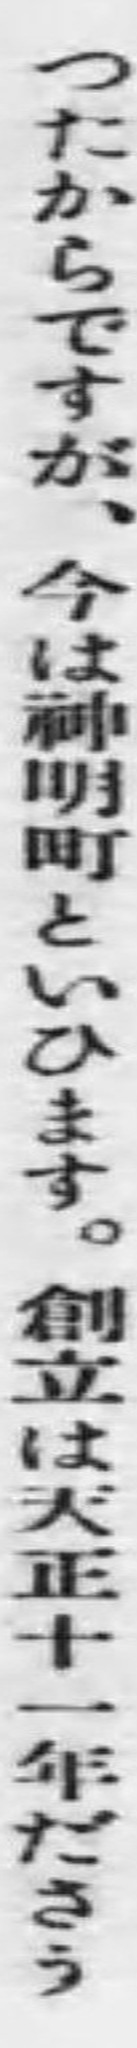つたからですが、今は神明町といひます。創立は天正十一年ださう
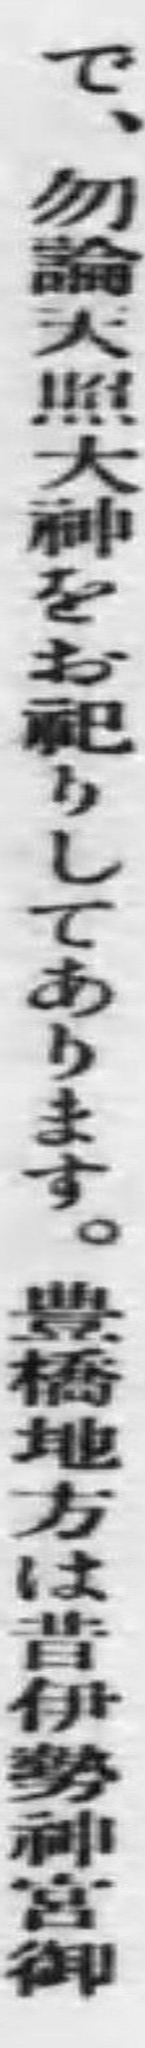で、勿論天照大神をお祀りしてあります。豊橋地方は昔伊勢神宮御
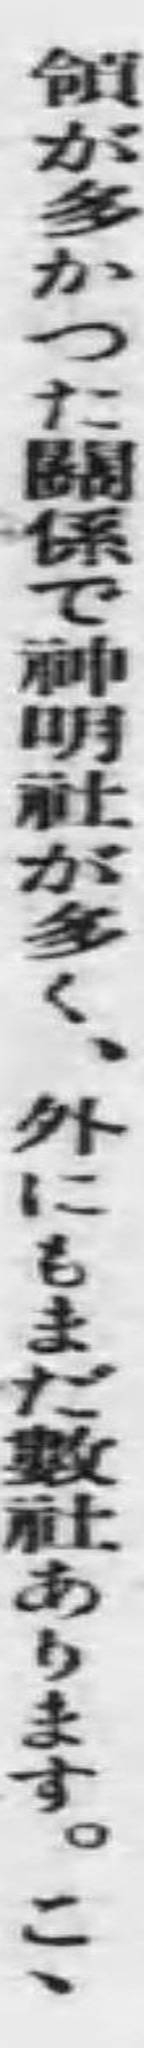領が多かつた関係で神明社が多く、外にもまた数社あります。こゝ
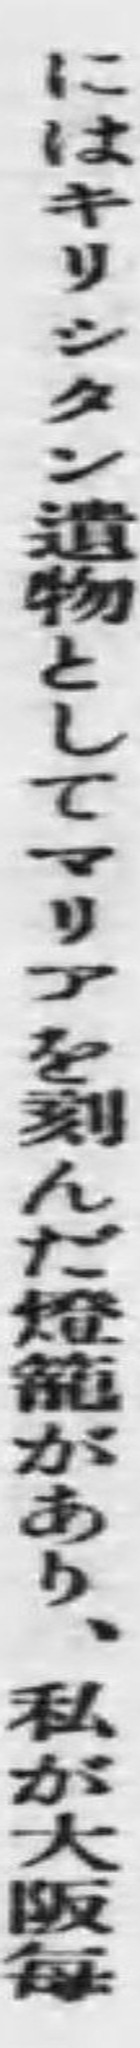にはキリシタン遺物としてマリアを刻んだ灯籠があり、私が大阪毎
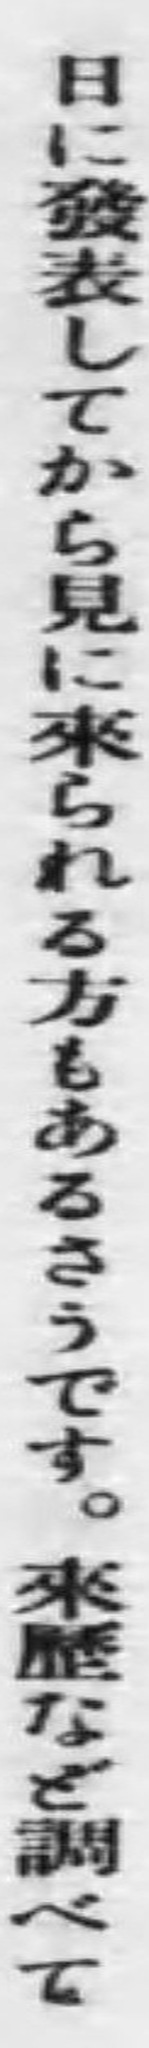日に発表してから見に来られる方もあるさうです。来歴など調べて
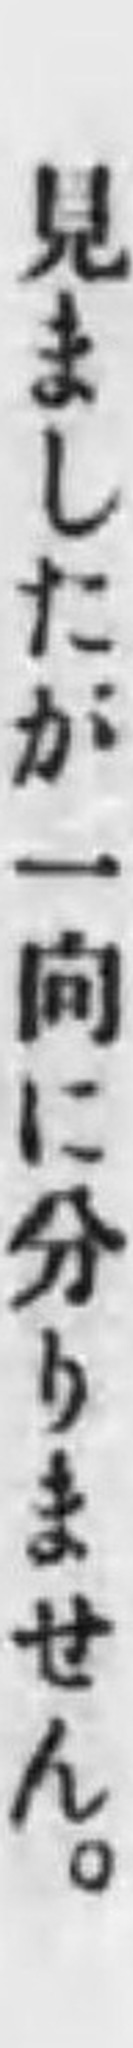見ましたが一向に分りません。
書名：東三河道中記 : 豊橋市及其附近案内
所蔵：国立国会図書館 National Diet Library, JAPAN
